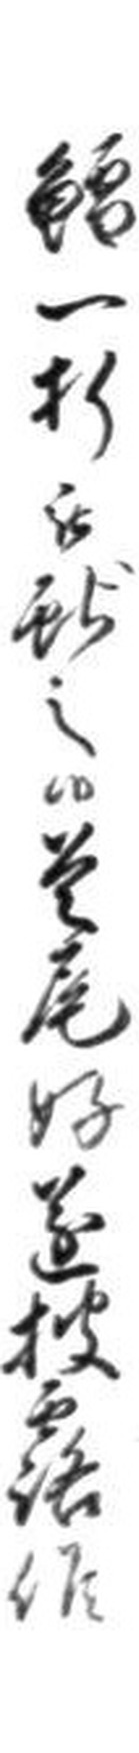鱈一折被献之候首尾好遂披露作
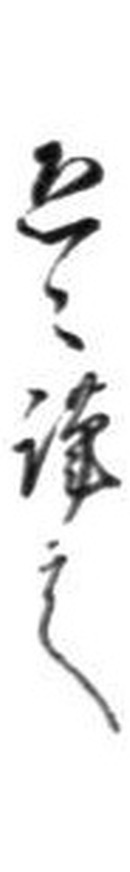恐々謹言
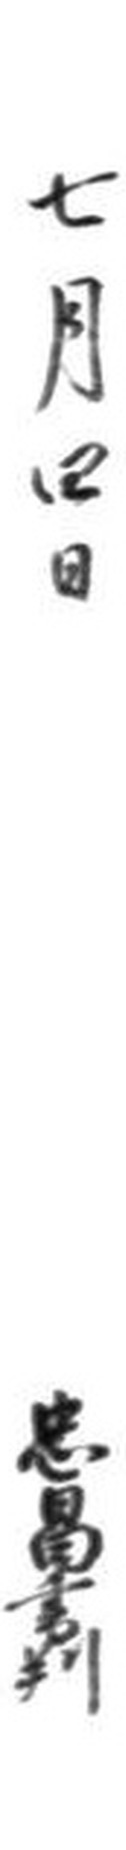七月四日忠昌書判
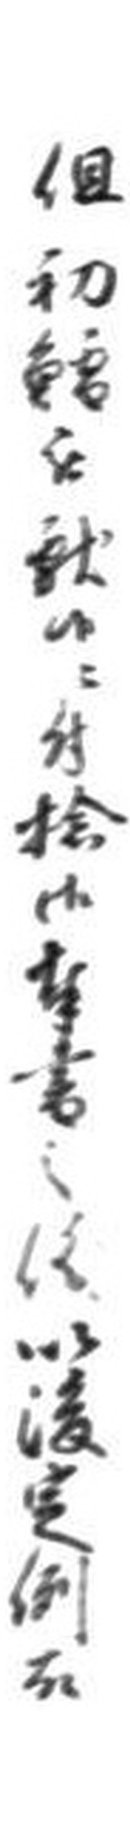但初鱈被献候ニ付捻御奉書之儀以後定例故
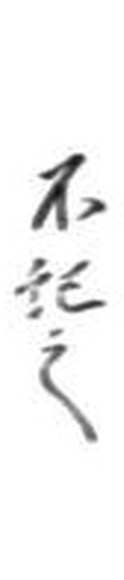不記之
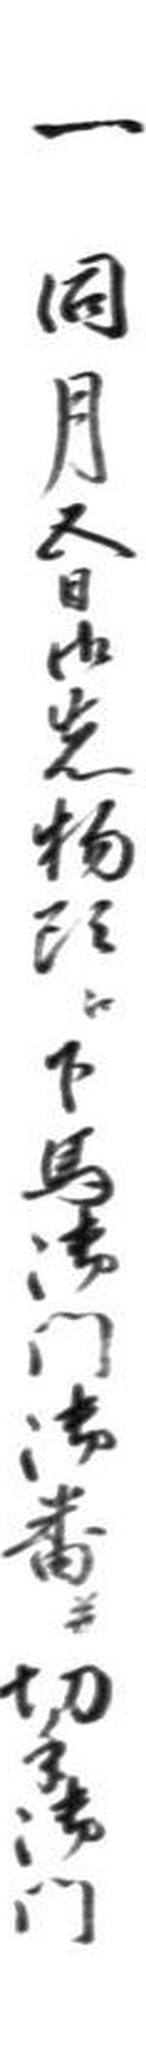一同月五日御先物頭江下馬御門番并切手御門
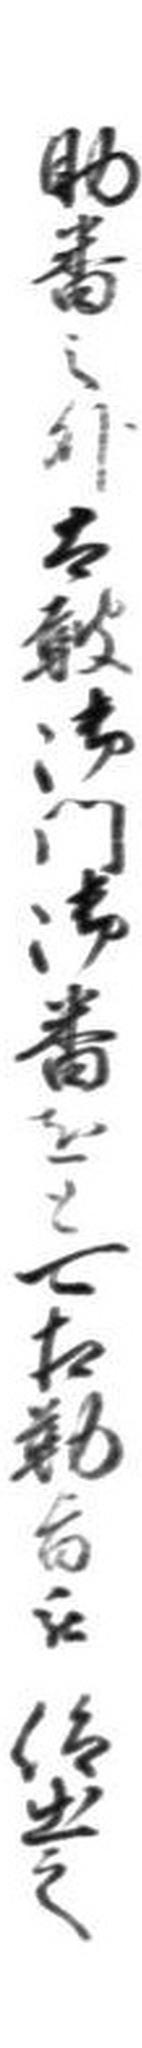助番之外太鼓御門番をも可相勤旨被仰出之
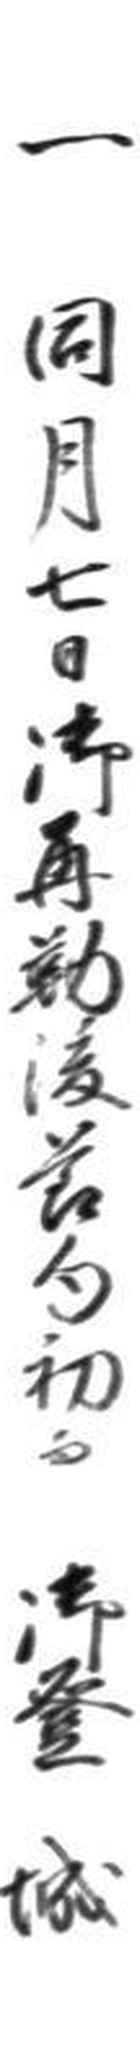一同月七日御再勤後節句初而御登城

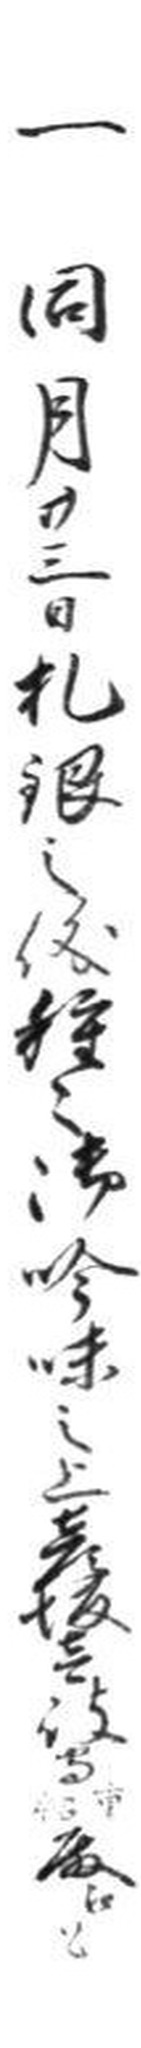一同月廿三日札銀之儀種々御吟味之上彦坂壱岐守重紹殿江も
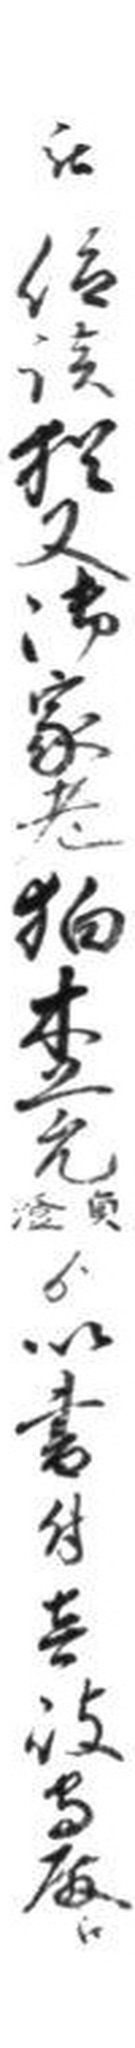被仰談猶又御家老狛杢允貞澄ゟ以書付壱岐守殿江
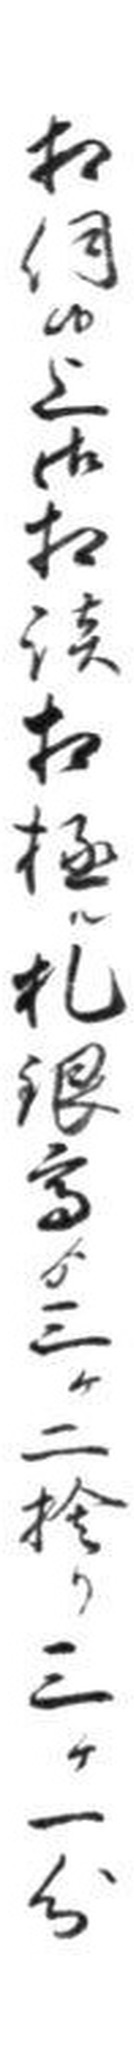御伺候上御相談相極ル札銀高ゟ三ケ二捨リ三ケ一分
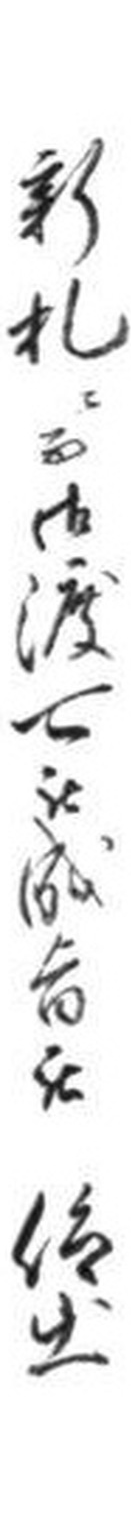新札ニ而御渡可被成旨被仰出
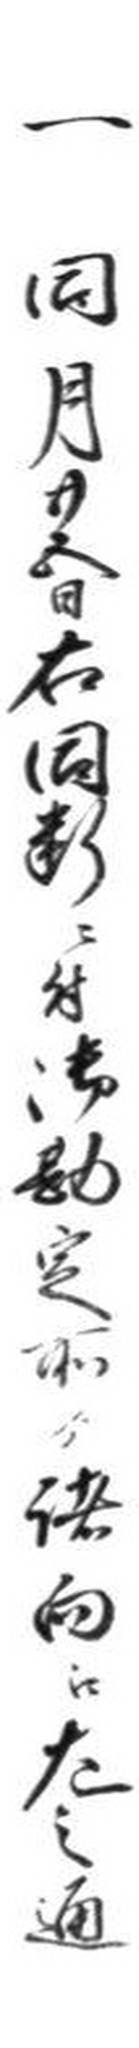一同月廿五日右同断ニ付御勘定所ゟ諸向江左之通
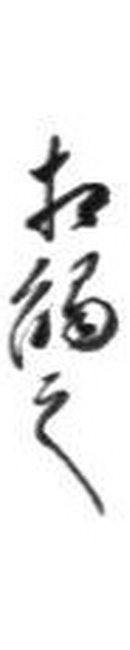相触之
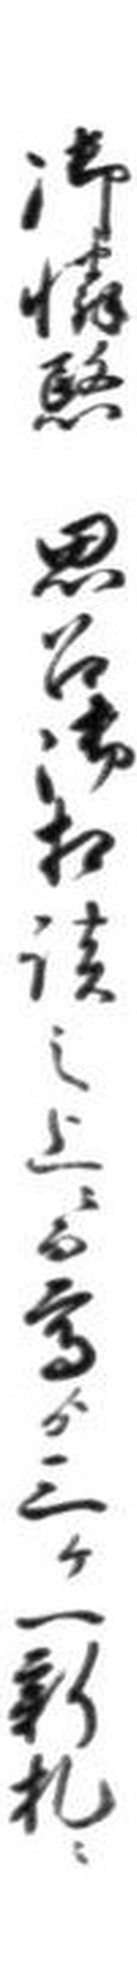御憐愍思召御相談之上ニ而高ゟ三ケ一新札ニ
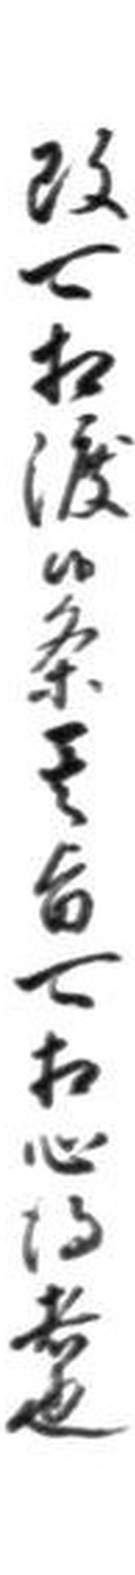改可相渡候条其旨可相心得者也
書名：家譜 十六 吉品公 従貞享三年閏三月到同四年
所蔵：福井県文書館 Fukui Prefectural Archives
